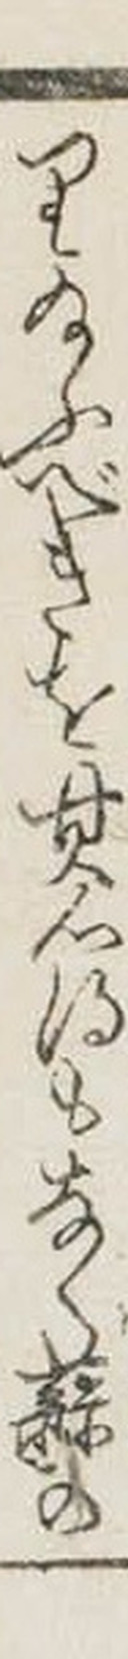りぬべきを其心得もなく蒜の
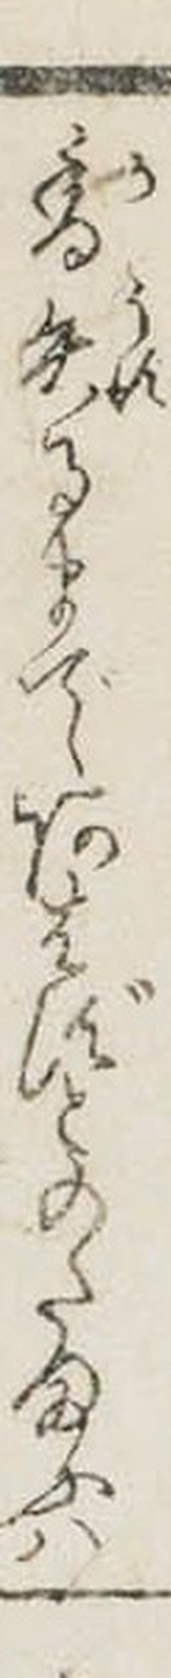香失るまであはずとのたまふは
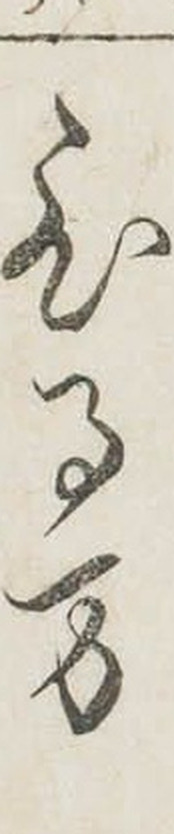ひるま
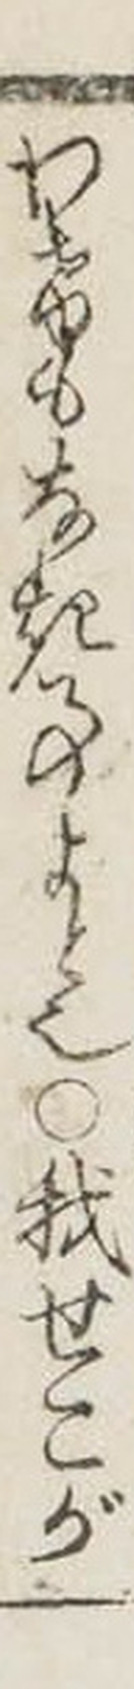わけもなき事よと也○我せこが
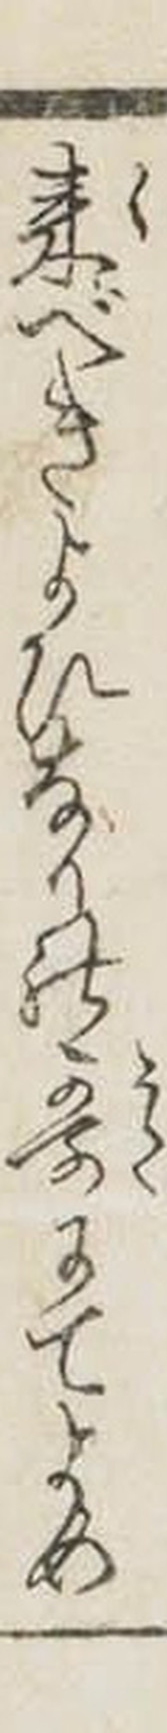来べきよひなりの哥にてよめ
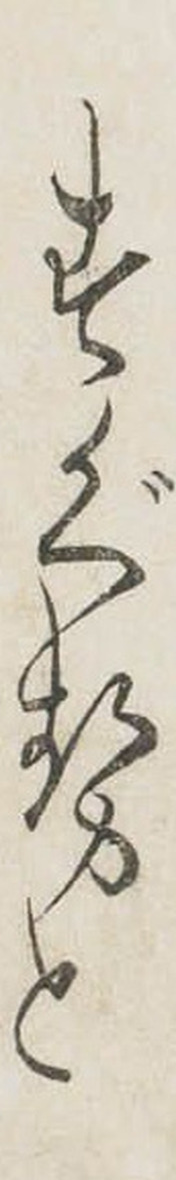すぐせと
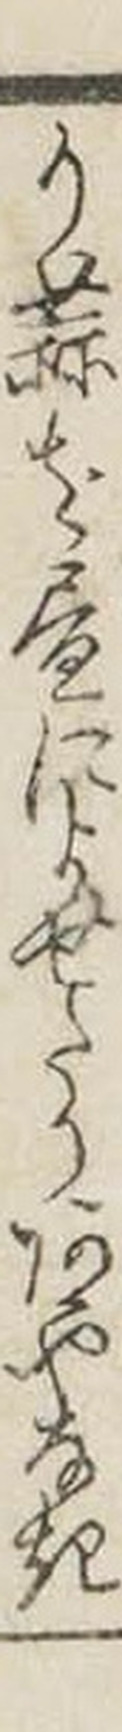り蒜を昼によせたりあやなき
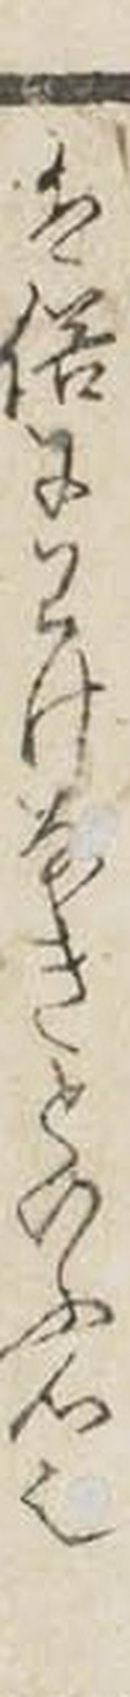は俗にわけなきといふ心也
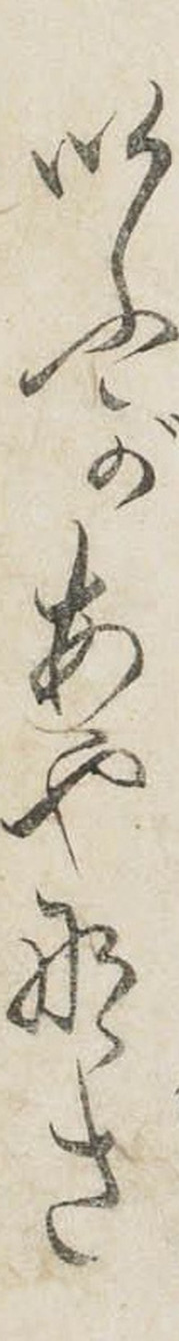いふがあやなさ

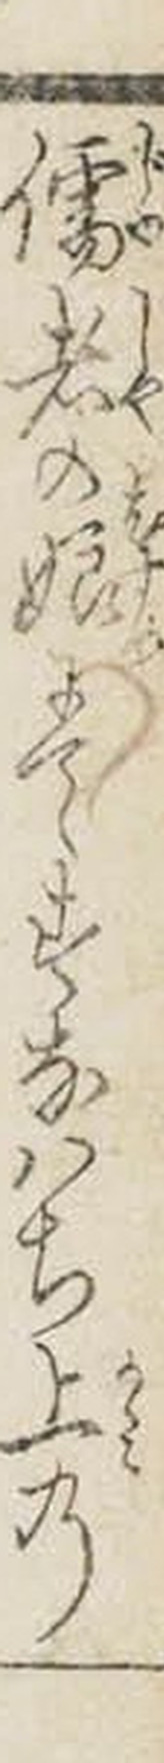儒者の娘にてすなはち上の
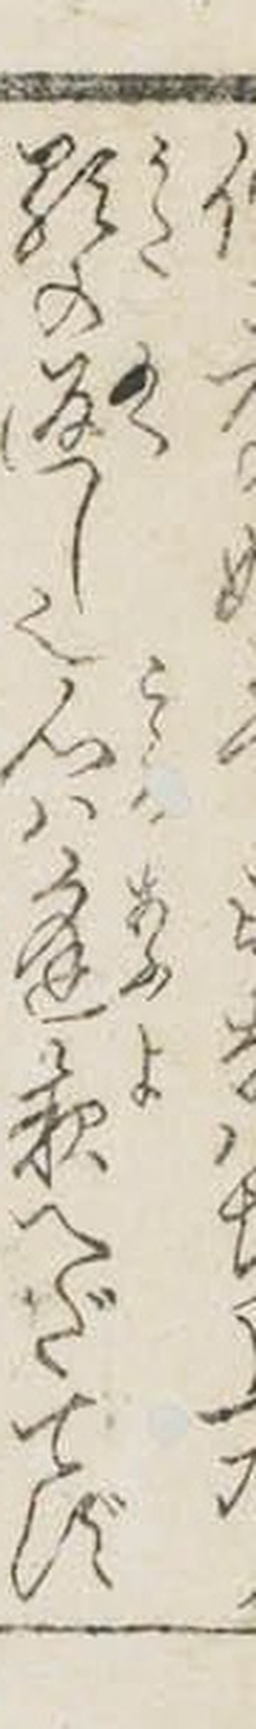歌の返し也心は逢夜へだてず
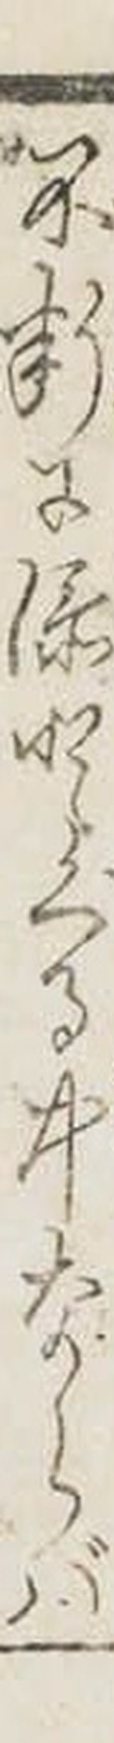不断に添とぐる中ならば
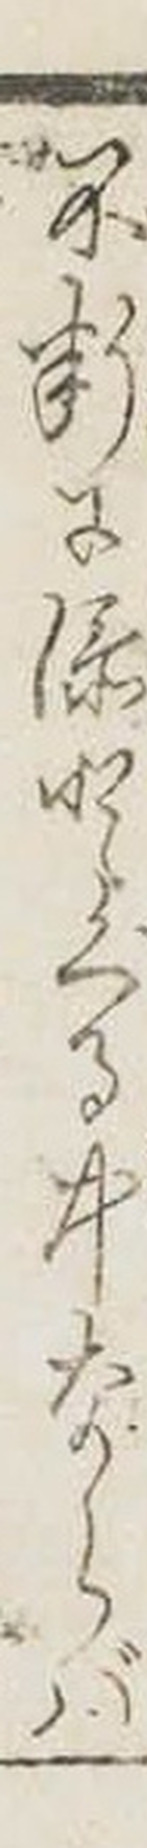不断に添とぐる中ならば
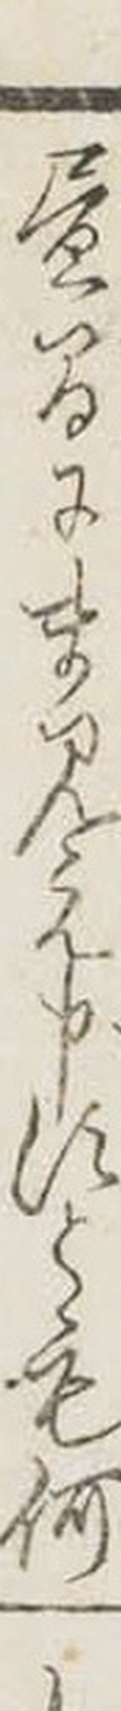昼間にま見え申すとも何
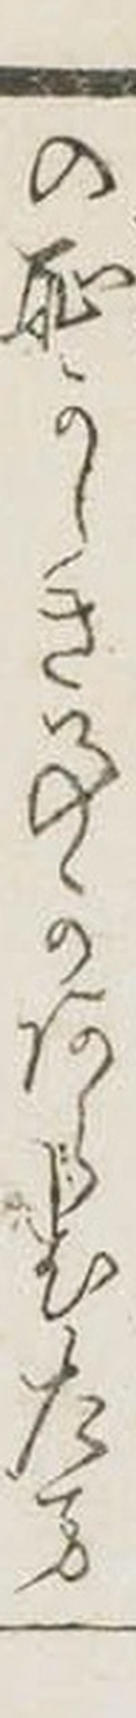の恥かしき事かあらむたま
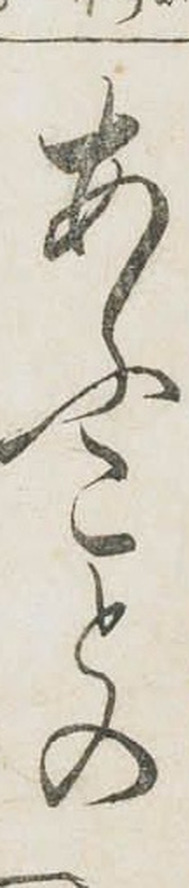あふことの
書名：源氏百人一首
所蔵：東京学芸大学教育コンテンツアーカイブ
